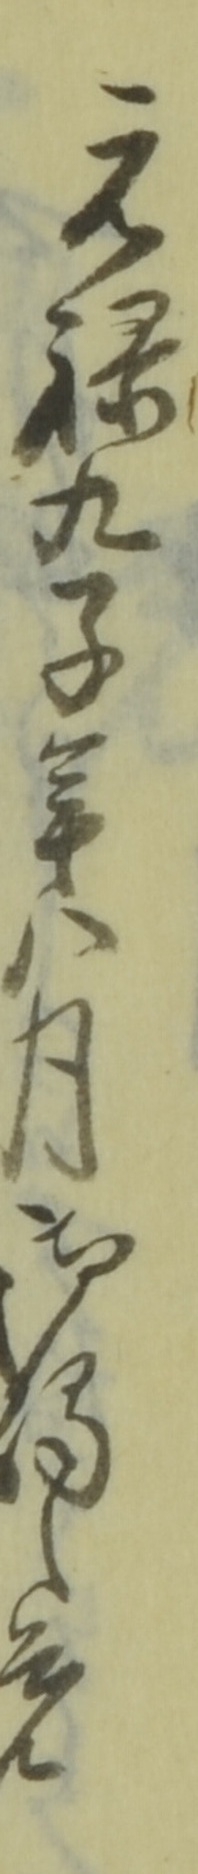元禄九子年八月御触候覚

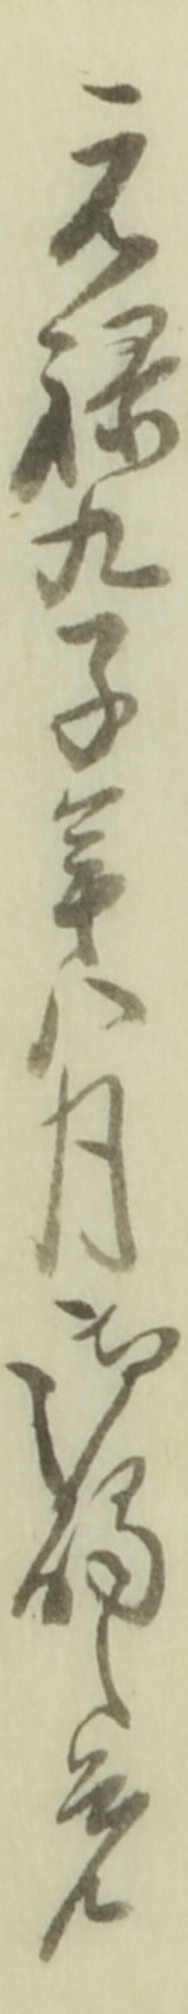元禄九子年八月御触之覚
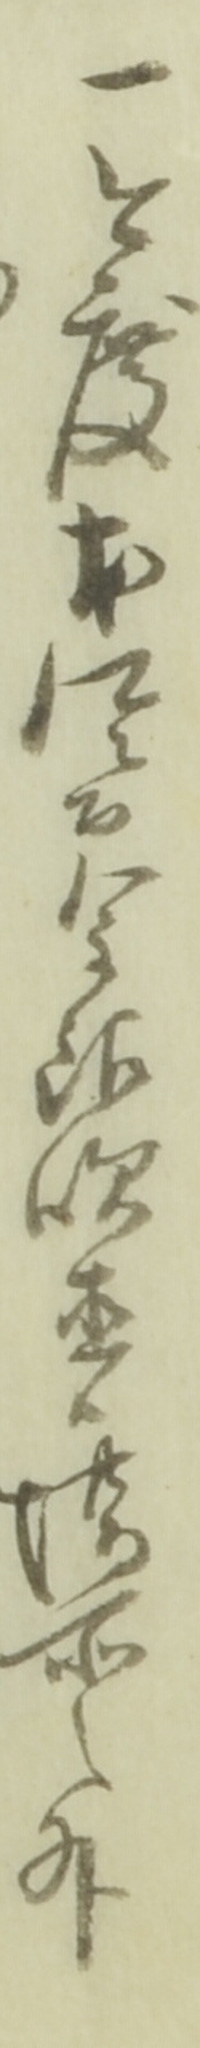一今度本郷ニ而金銀吹直候場所之外
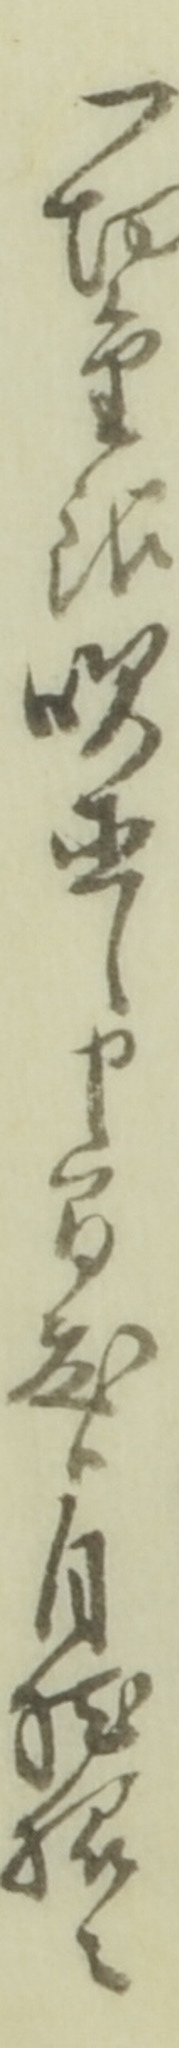一切金銀吹直し申間敷候自然脇々
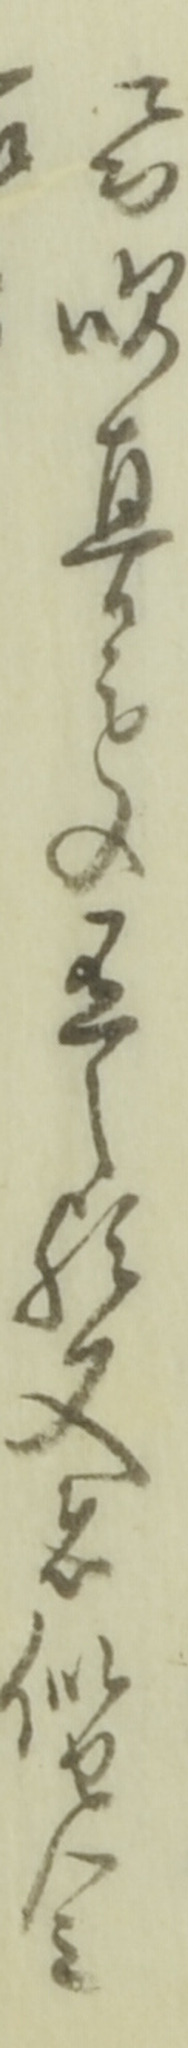ニ而吹直候もの有之歟又者似セ金
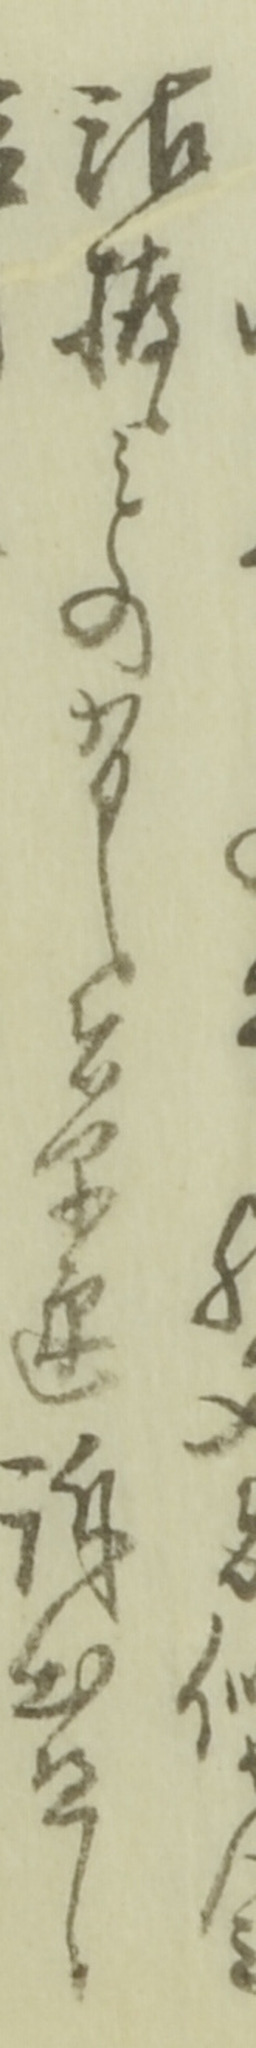銀拵候もの有之者早速訴出へし
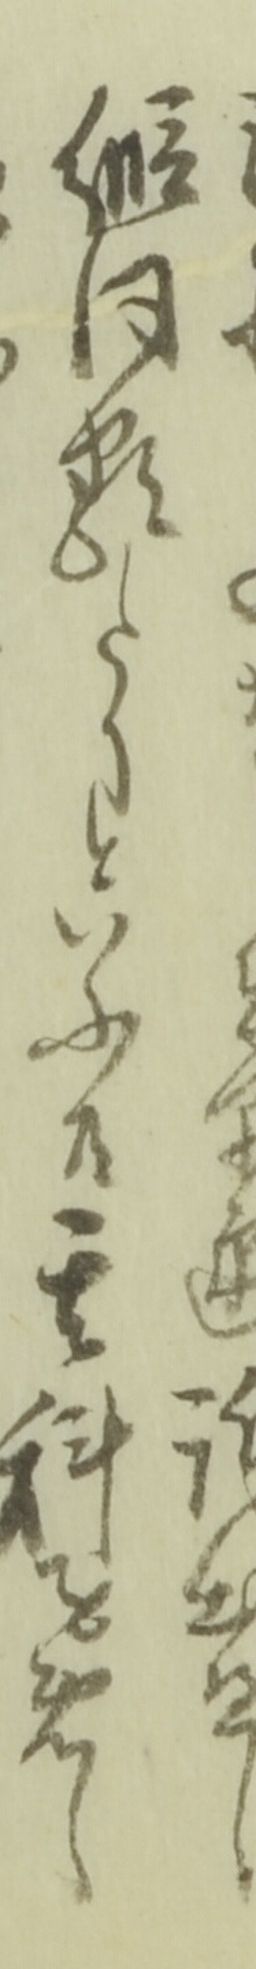縦同類たりといふ共其科を免し
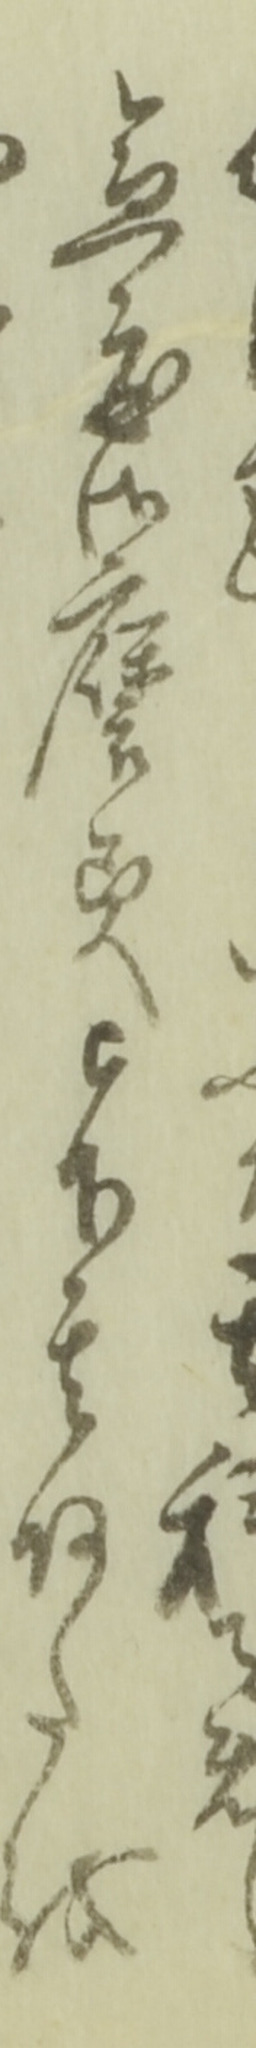急度御褒美被下其あたを
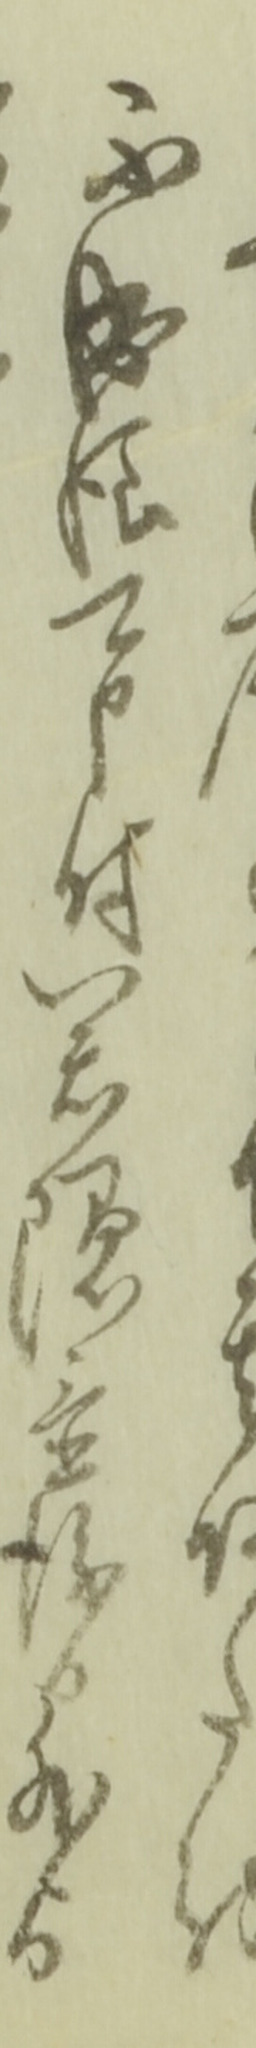不成様可申付若隠置後日外ゟ
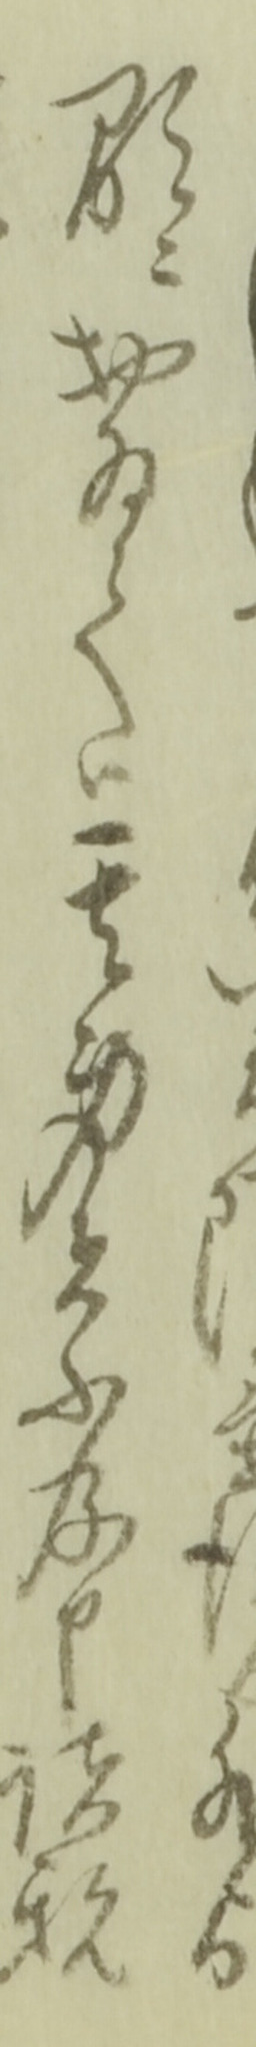顕二おゐてハ其身者不及申諸親
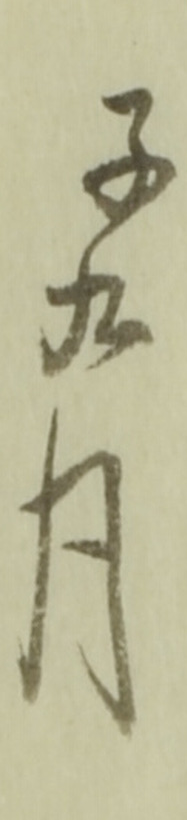子九月
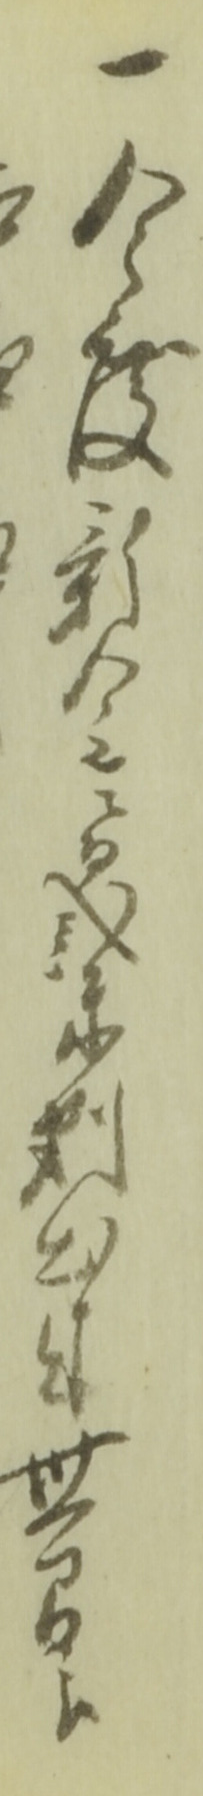一今度新金ニ而弐朱判出来世間江
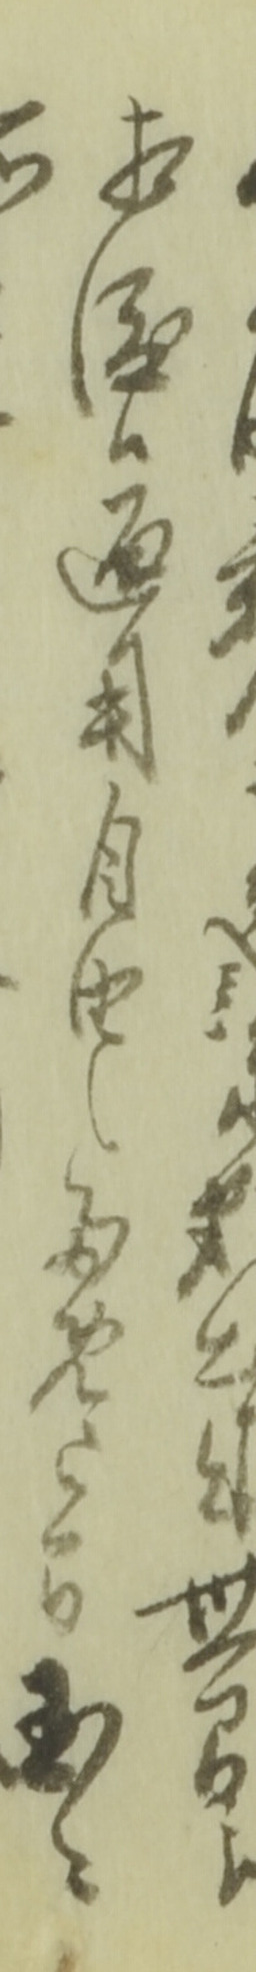相渡候通用自由之ためニ候間國々
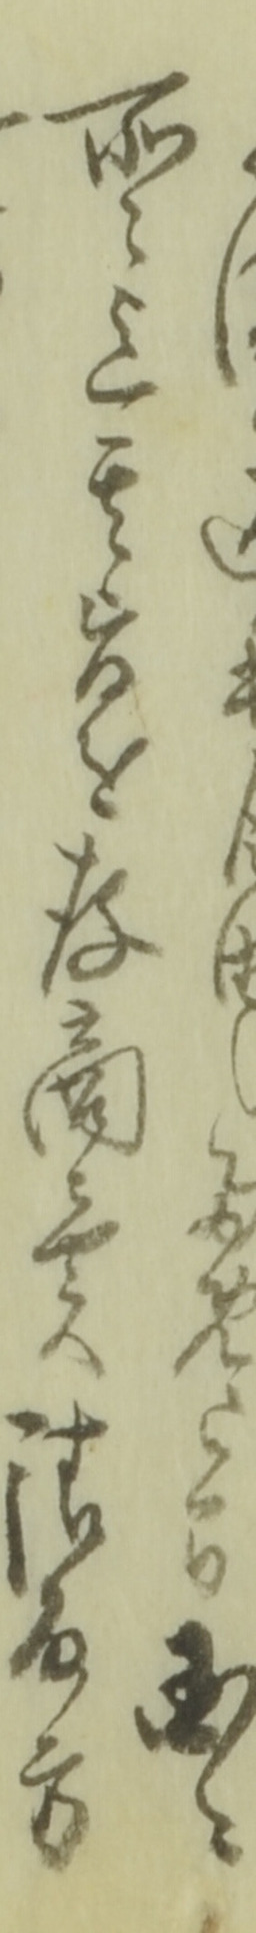所々迄其旨を存商売御取方
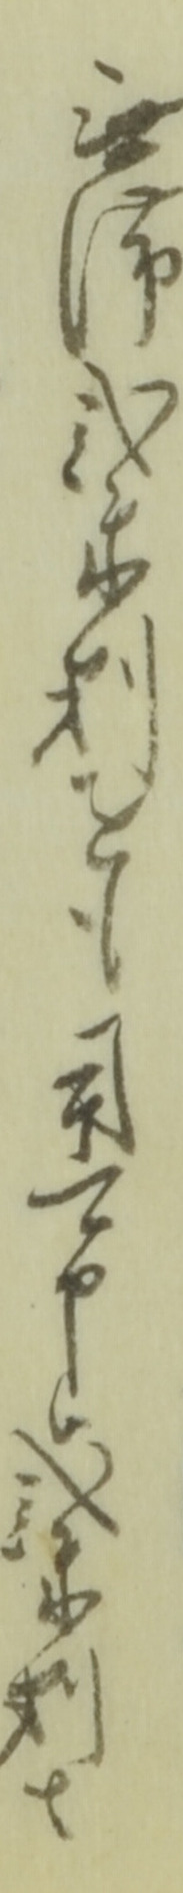無滞弐朱判をも用可申候弐朱判者
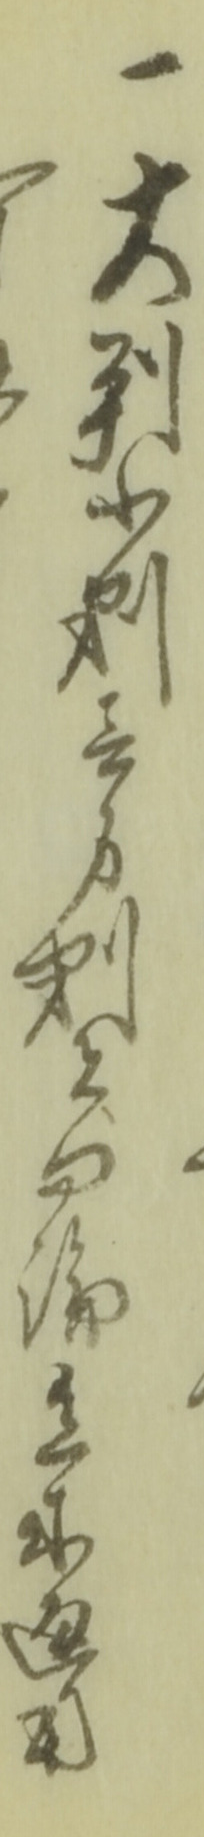一大判小判壱分判者勿論有来通用
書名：御公儀様御領主様御触書控
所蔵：伊那市立高遠町図書館・合同会社AMANE
